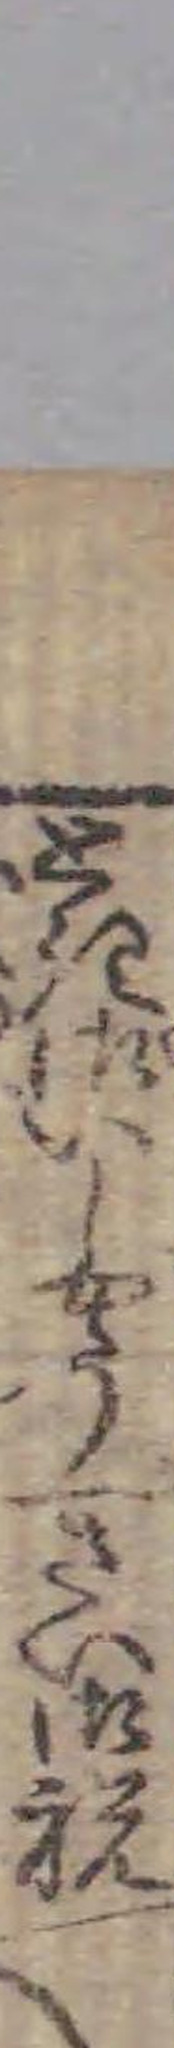とき御いしやう一さい御祝
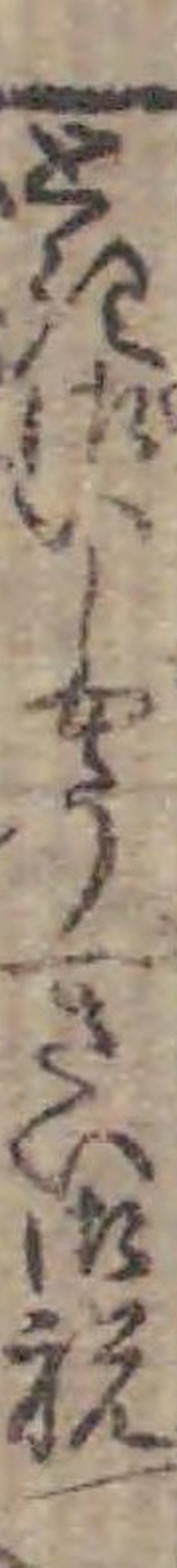とき御いしやう一さい御祝
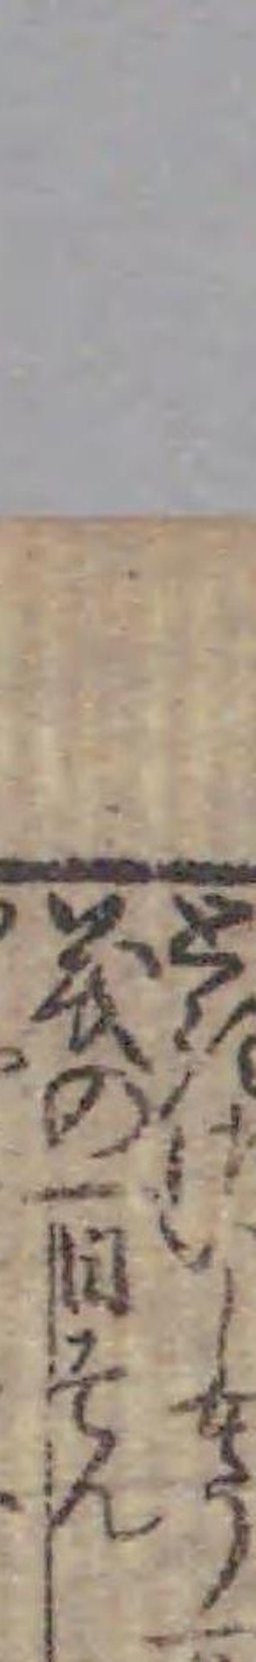義の一日そん
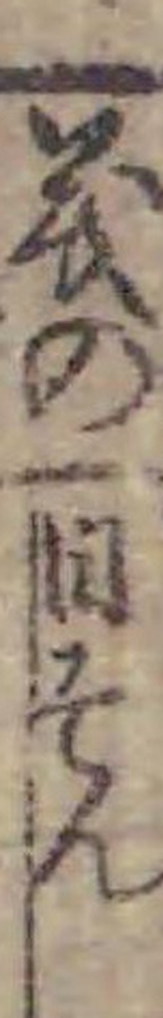義の一日そん
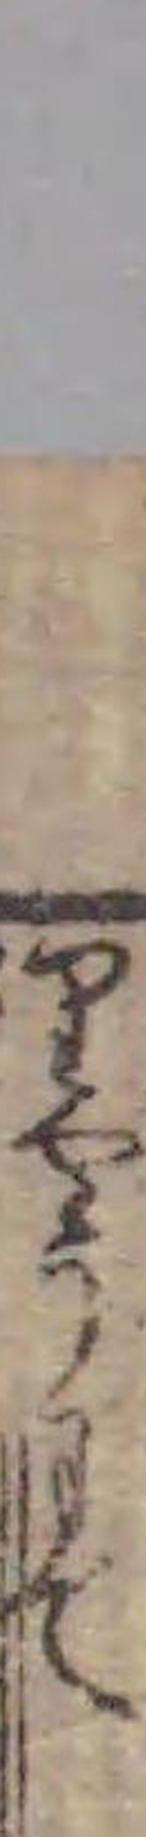りやうにて
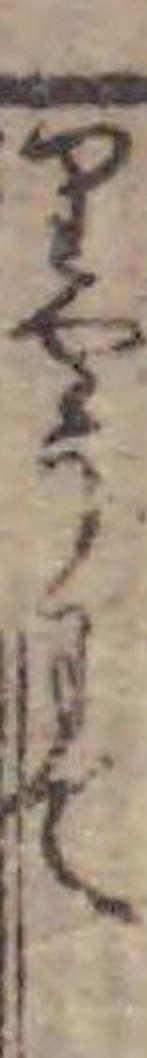りやうにて
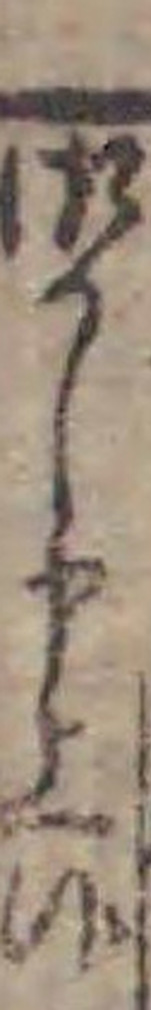御かし申上候
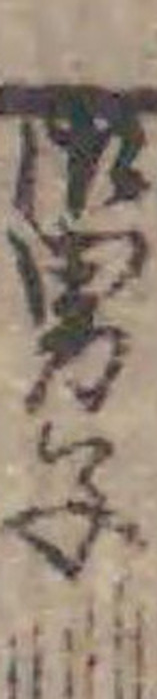御男子
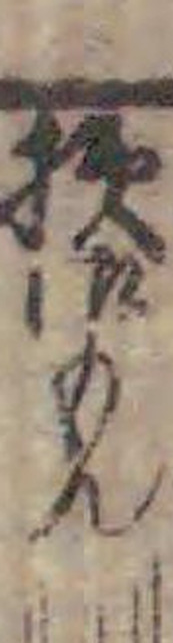様御もん
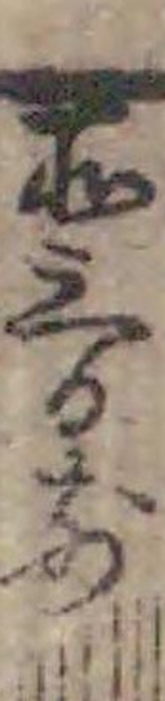所三日前
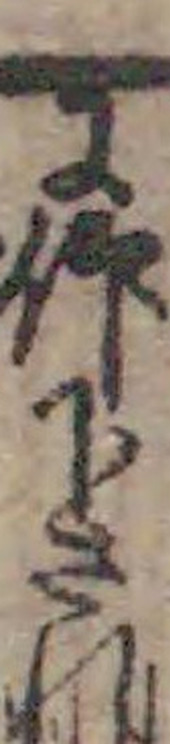に仰下され
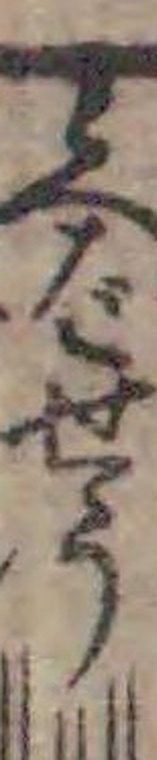候へばせう
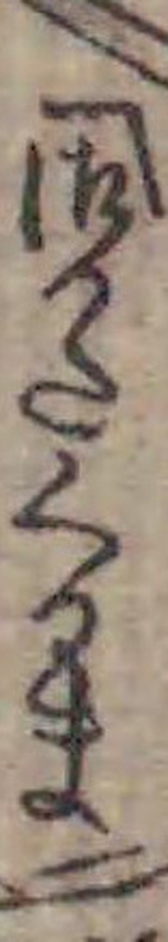〽御かたくるま
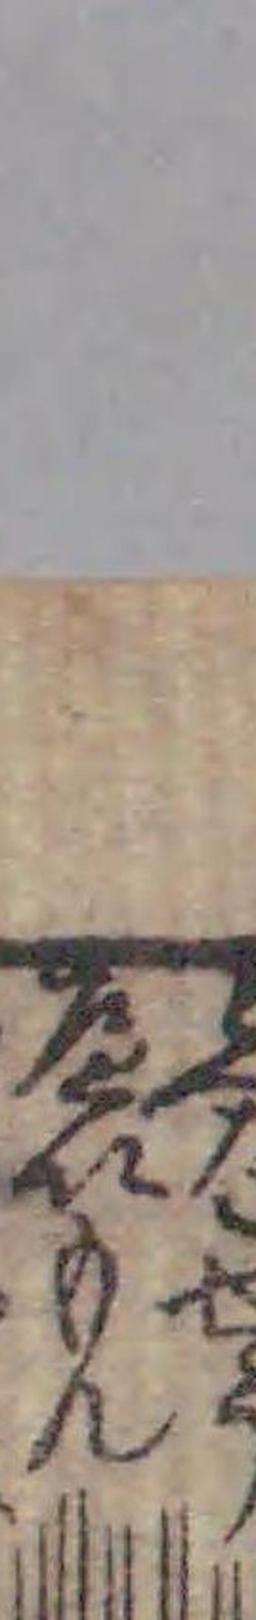へいもん
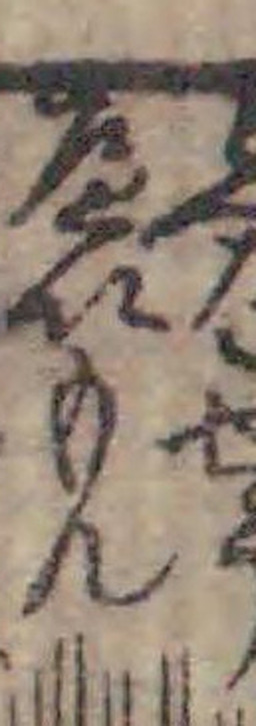へいもん
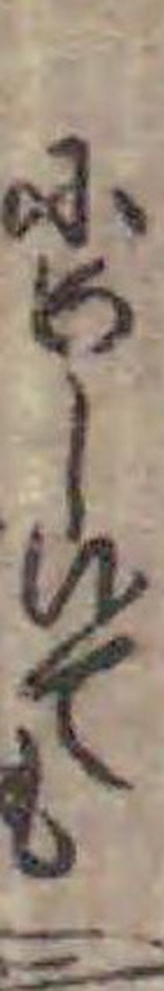にめし候ても
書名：本樹真猿浮気噺 : 3巻
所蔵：国立国会図書館 National Diet Library, JAPAN
